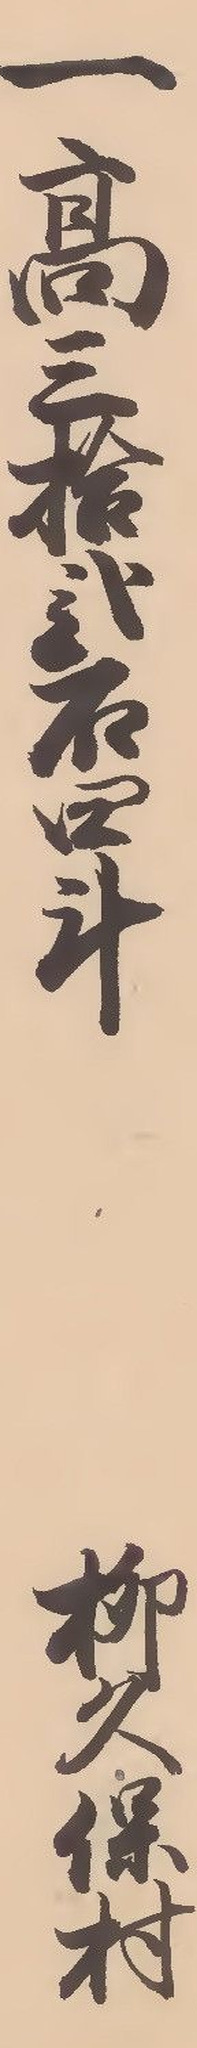一高三拾弐石四斗柳久保村
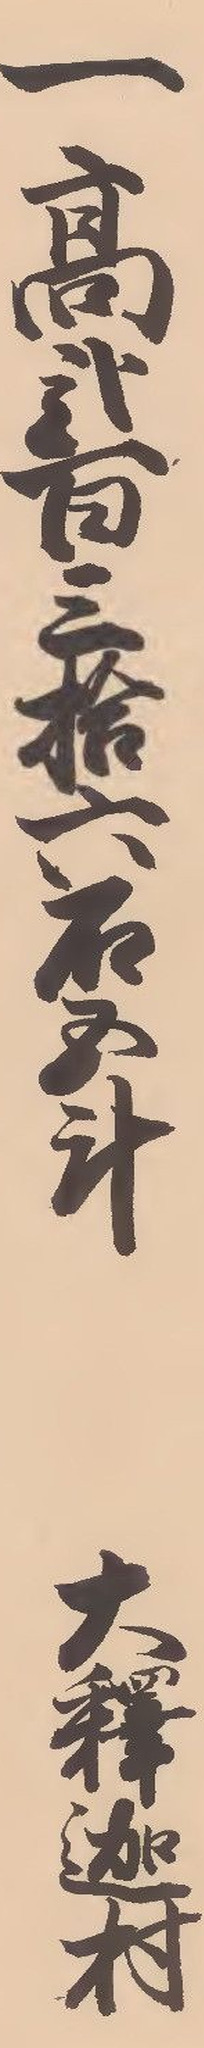一高弐百三拾六石五斗大釈迦村
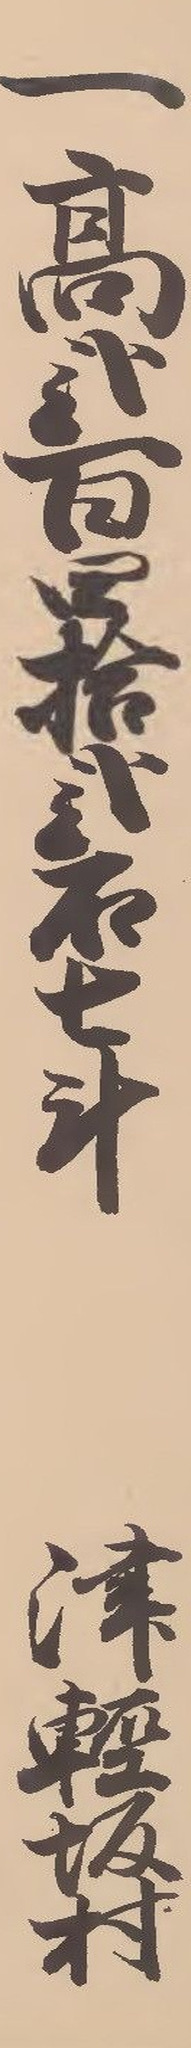一高弐百四拾弐石七斗津軽坂村
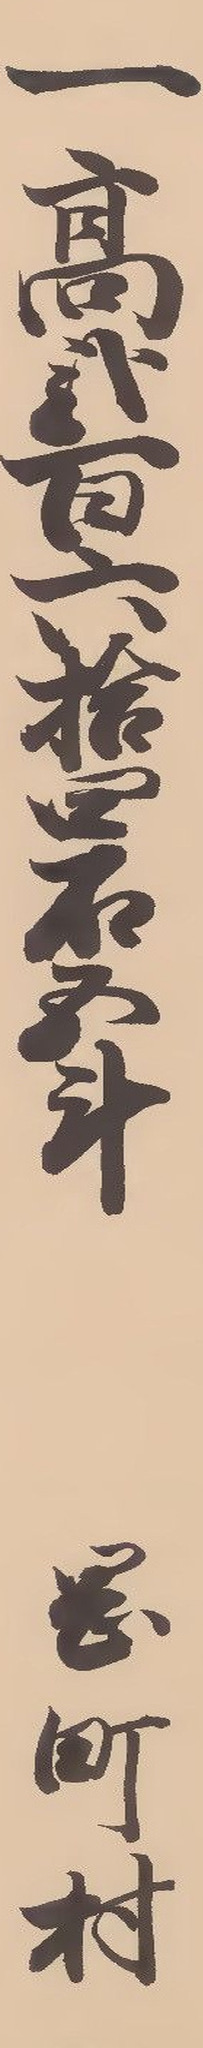一高弐百六拾四石五斗岡町村
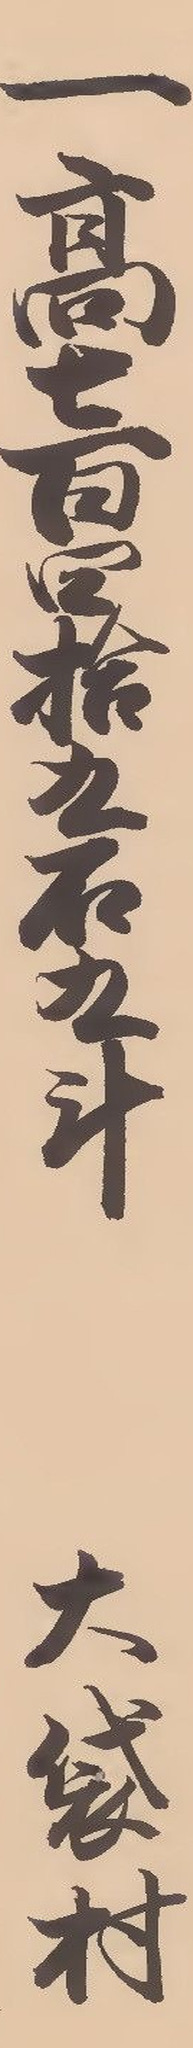一高七百四拾九石九斗大袋村

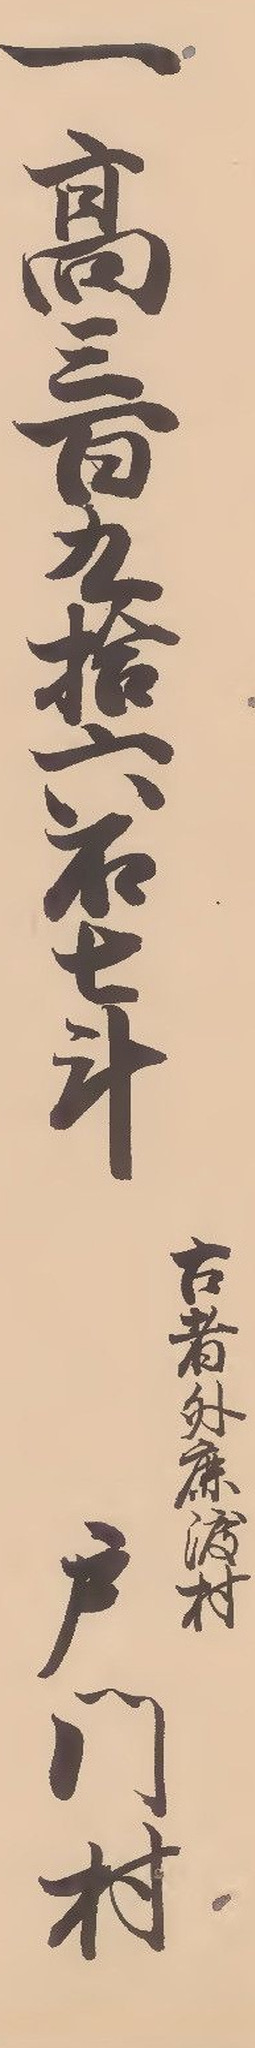一高三百九拾六石七斗戸門村
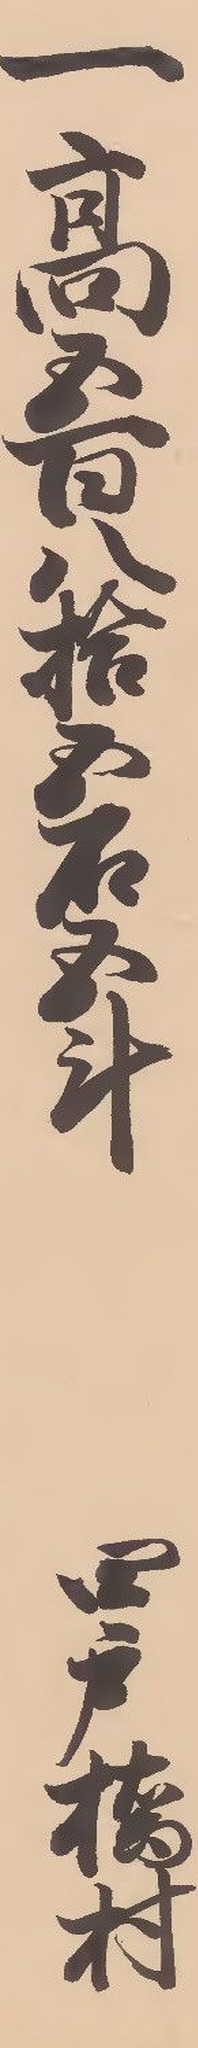一高五百八拾五石五斗四戸橋村
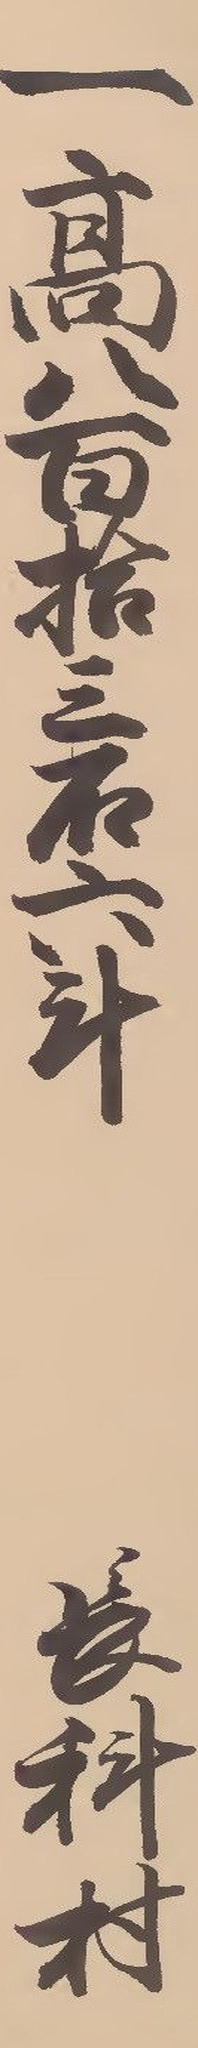一高八百拾三石六斗長科村
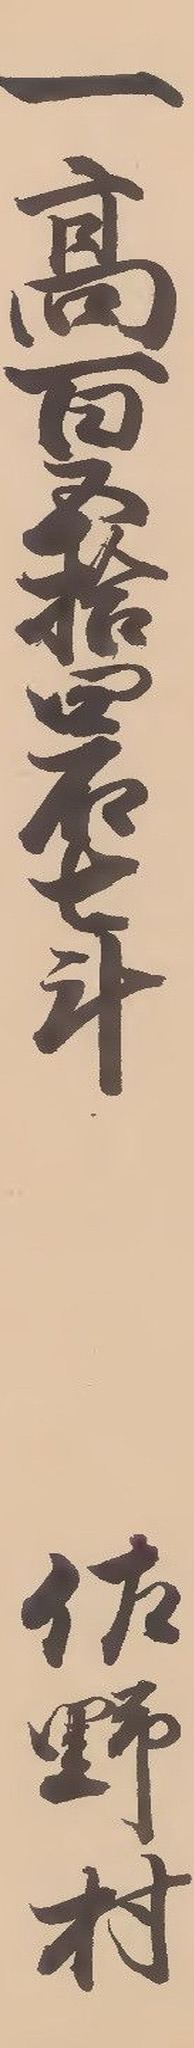一高百五拾四石七斗佐野村
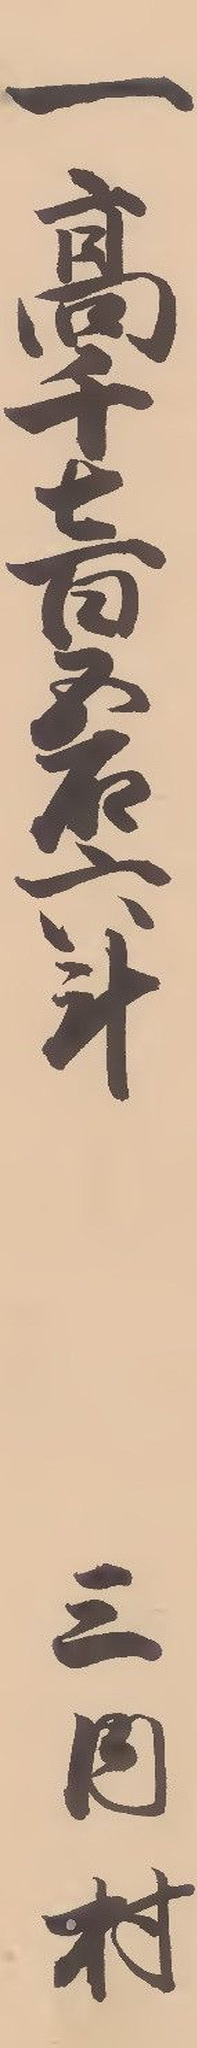一高千七百五石六斗三内村

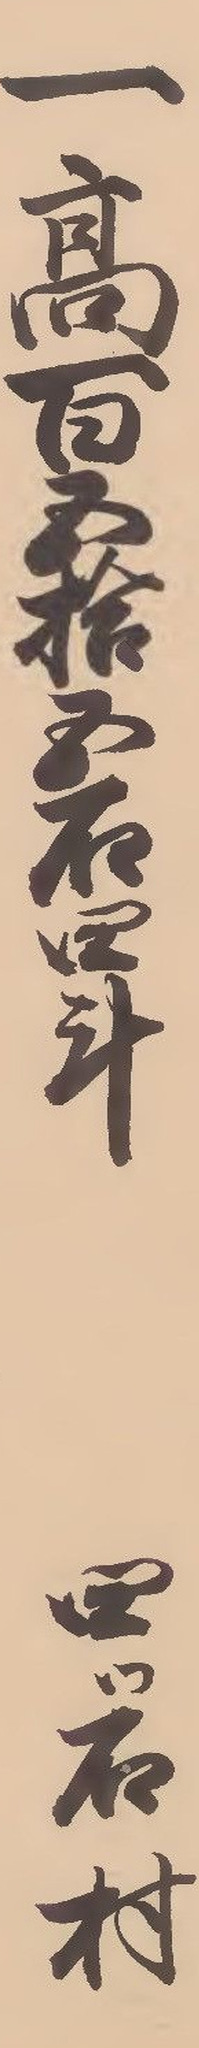一高百五拾五石四斗四ツ石村
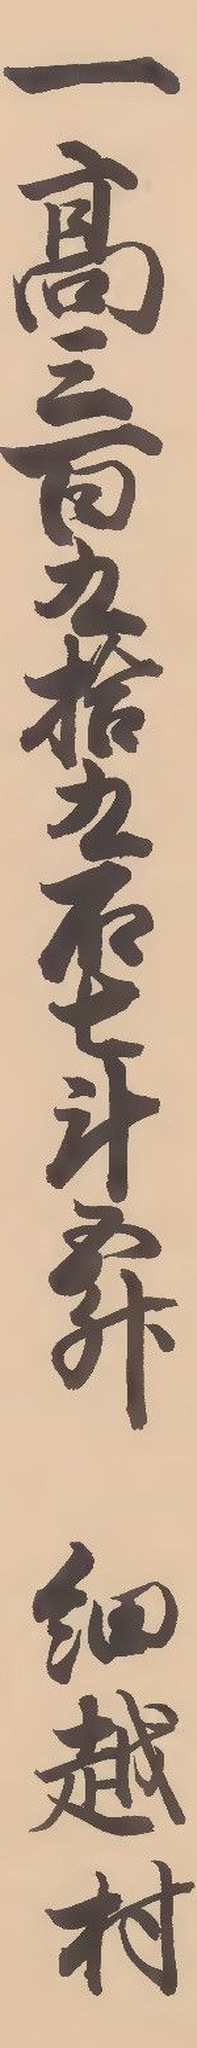一高三百九拾九石七斗五升細越村
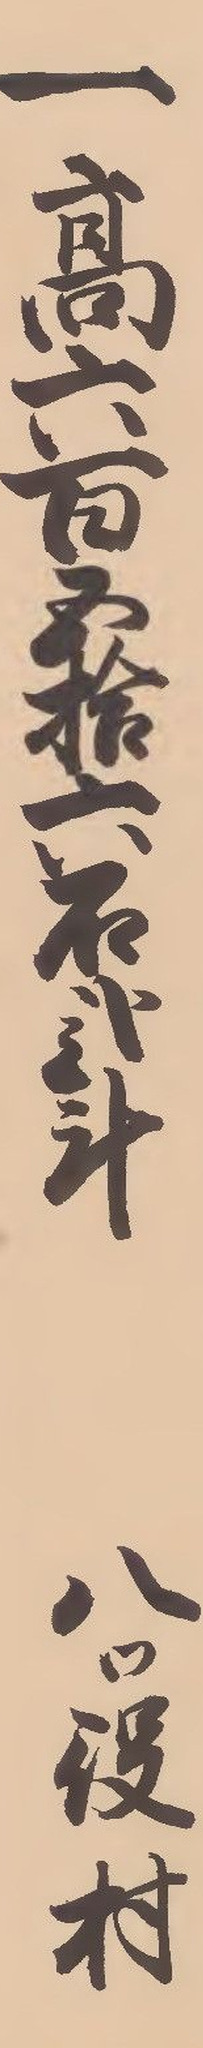一高六百五拾六石弐斗八ツ役村
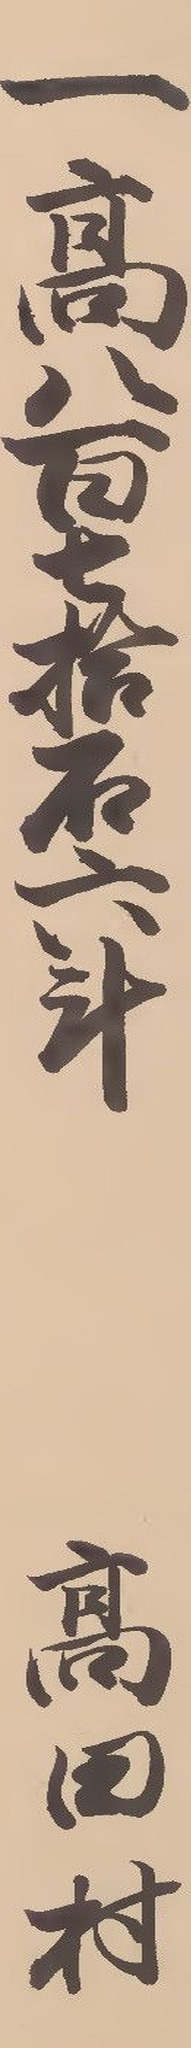一高八百七拾石六斗高田村
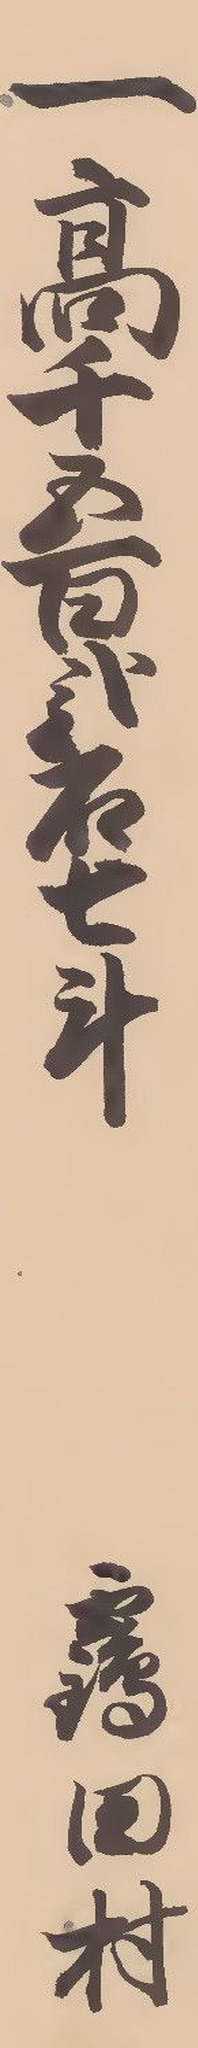一高千五百弐石七斗鶴田村

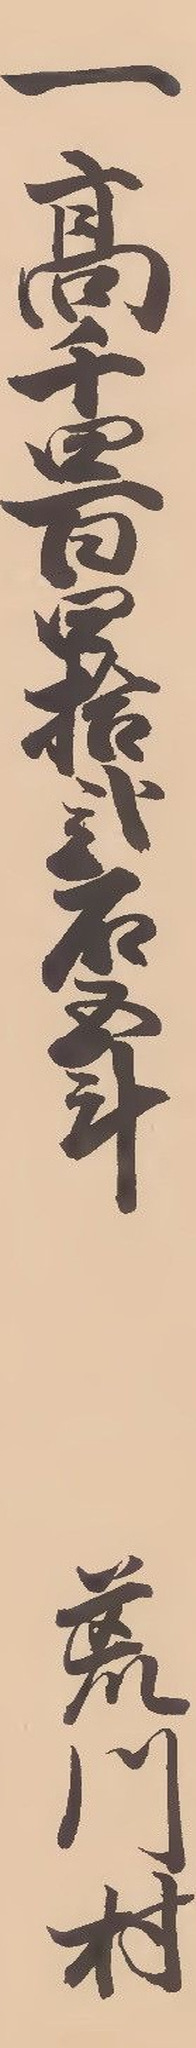一高千四百四拾弐石五斗荒川村
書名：陸奥国郷帳　７
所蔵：国立公文書館 National Archives of Japan
